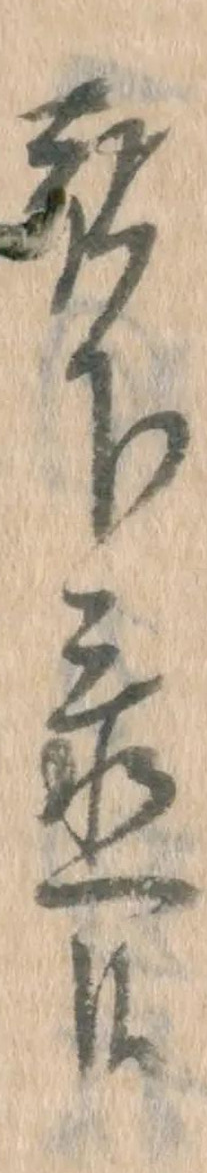被下置候

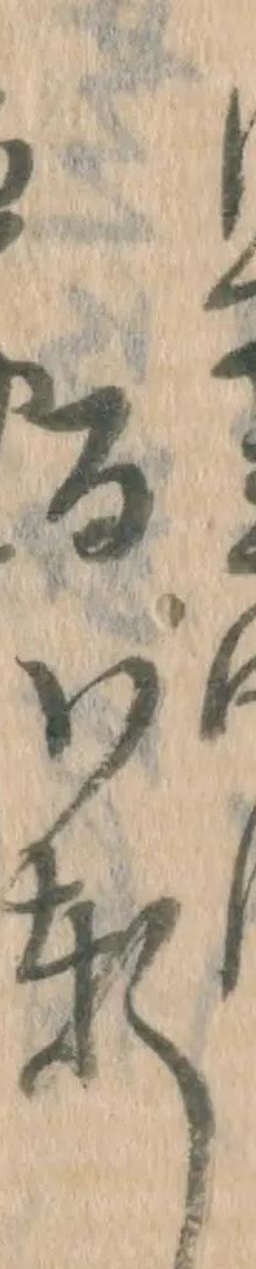百八軒
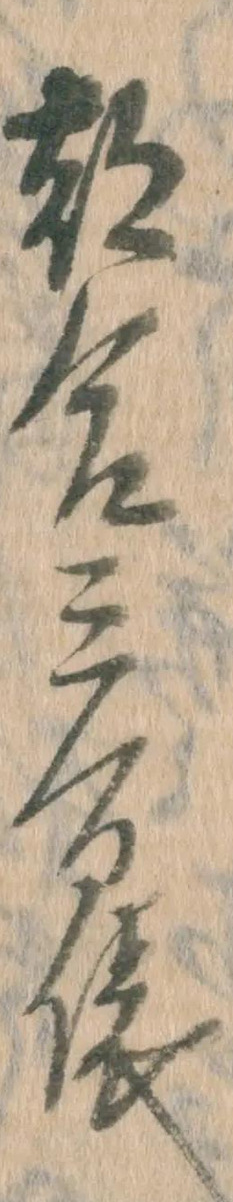都合三百俵
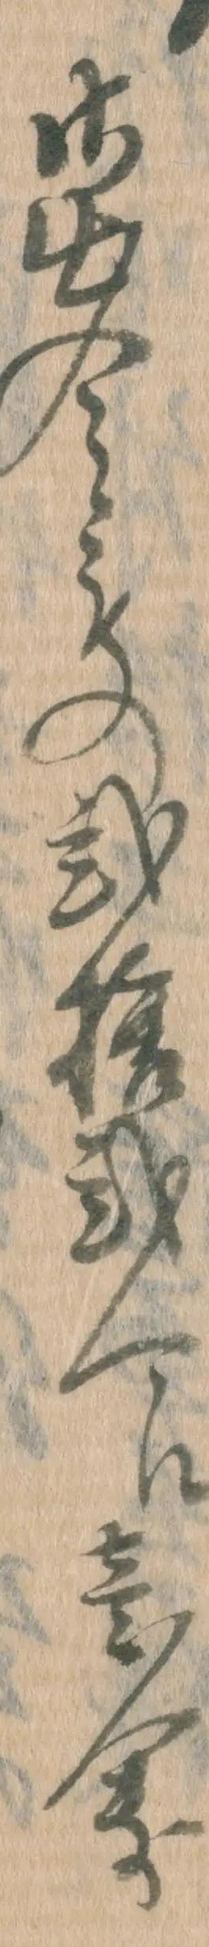御出入之もの弐拾弐人え壱人前
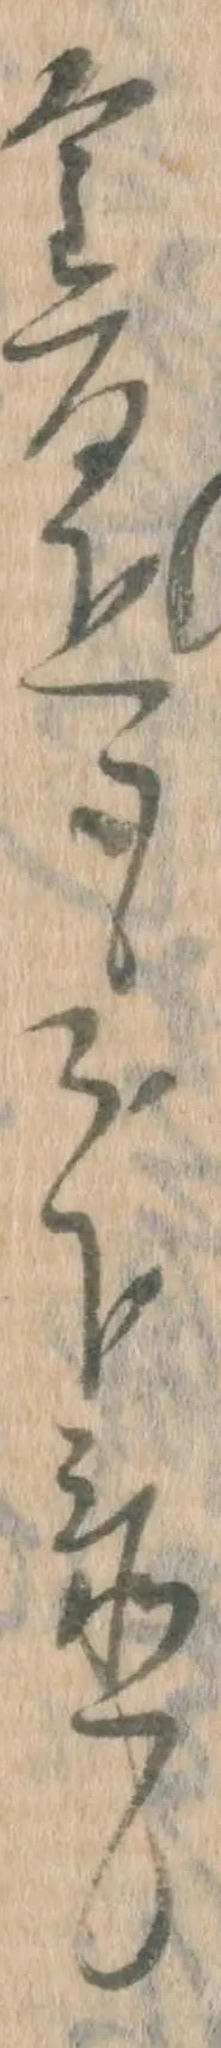金百疋ツヽ被下置候
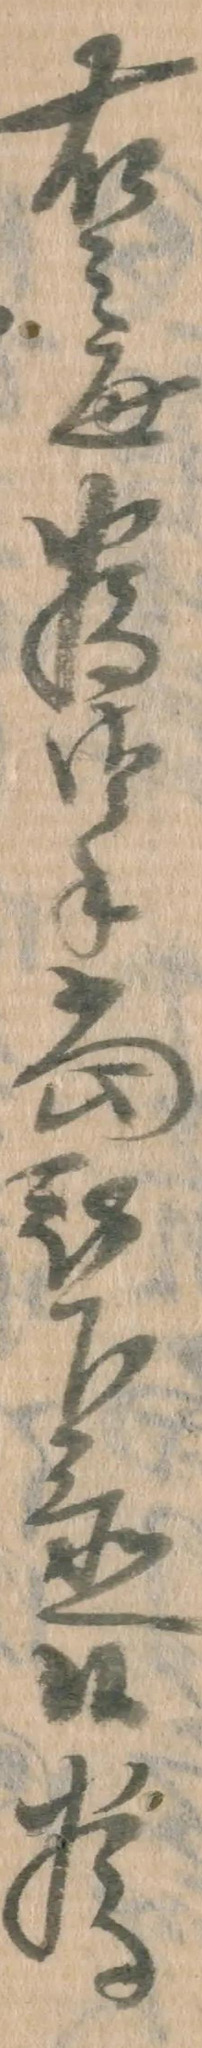右之通為御手当被下置候為
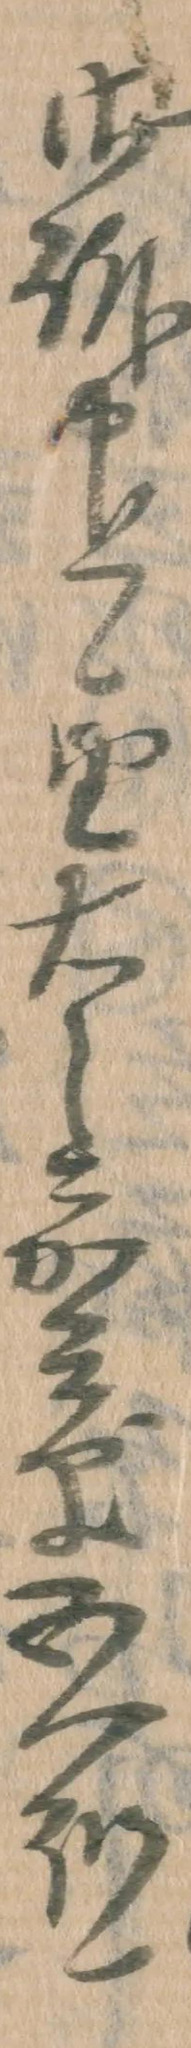御訴申上候由右之嘉兵衛五人組
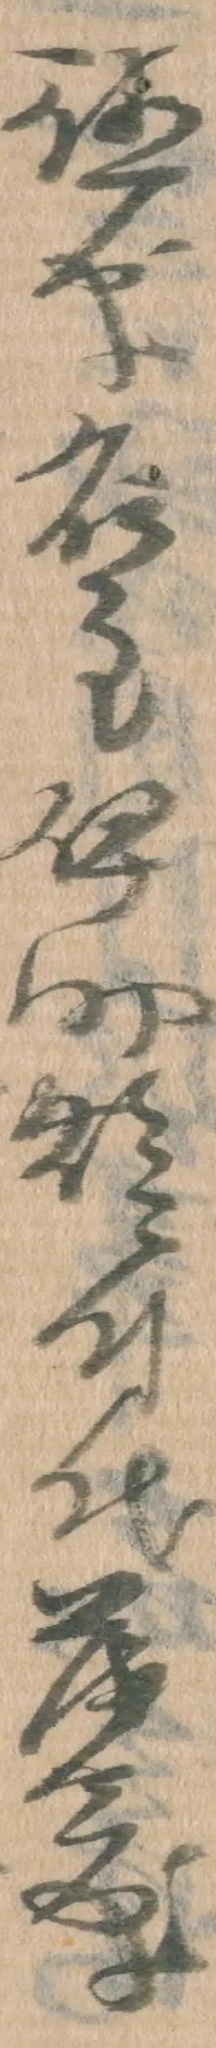徳衛名主伊助煩ニ付代茂兵衛
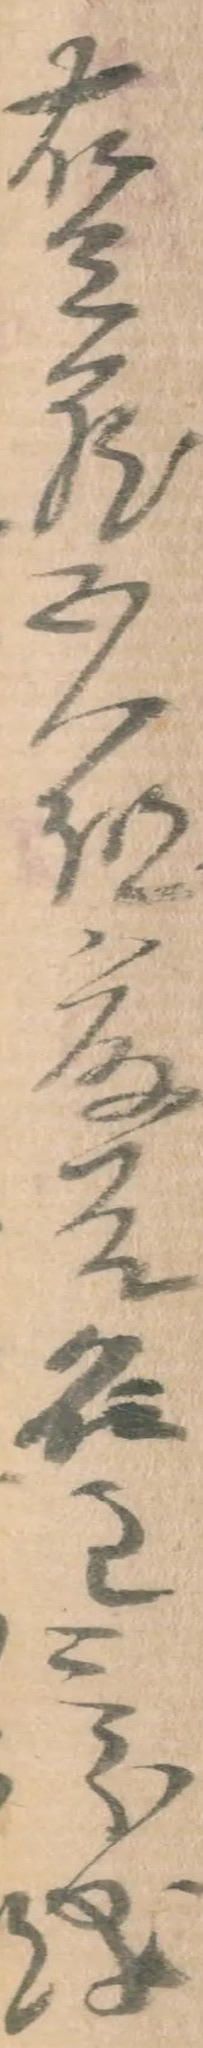右兵蔵五人組藤吉名主三郎衛
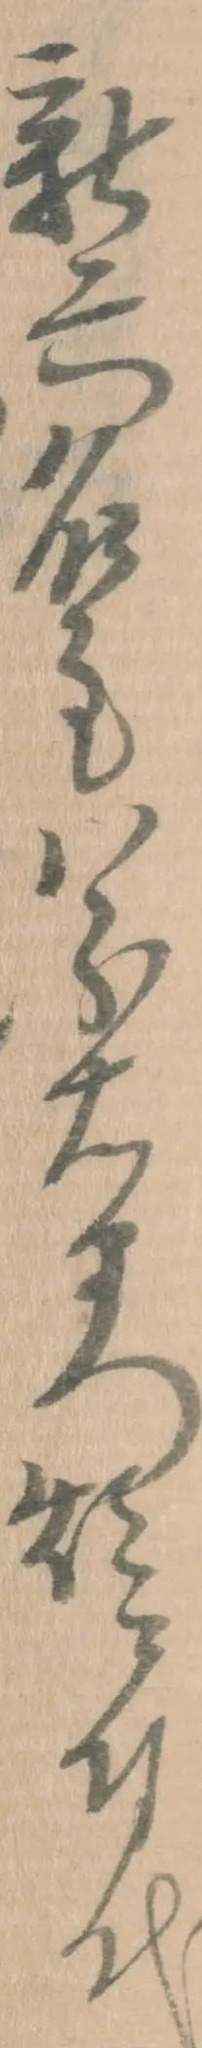新六名主八郎右衛門煩ニ付代

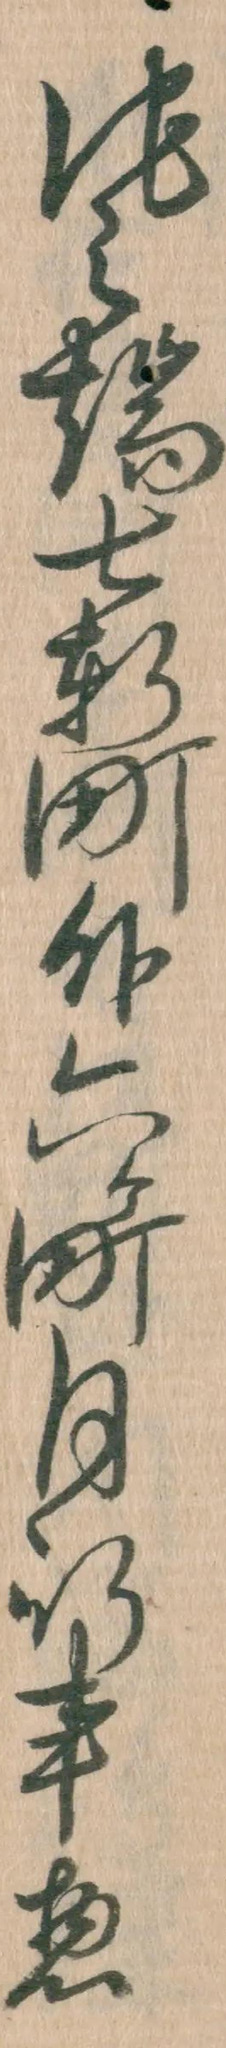一、池之端七軒町外六ヶ町月行事惣
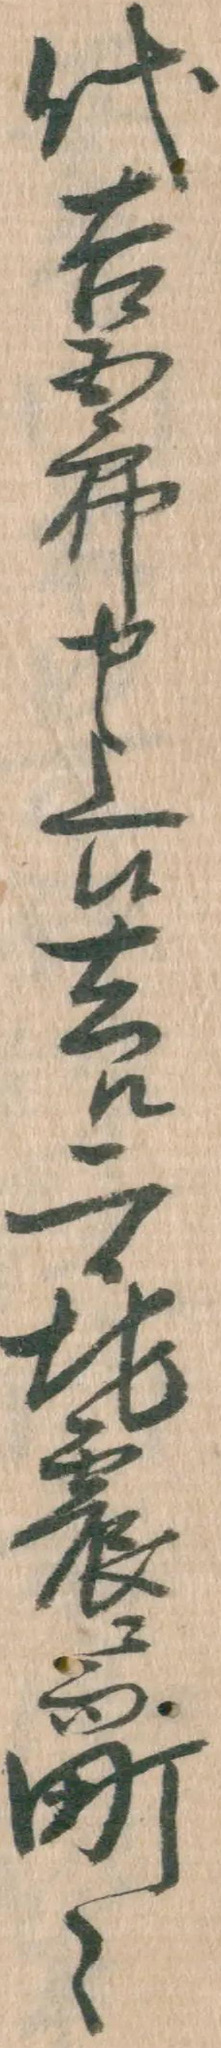代吉五郎申上候去ル二日地震ニ而町々
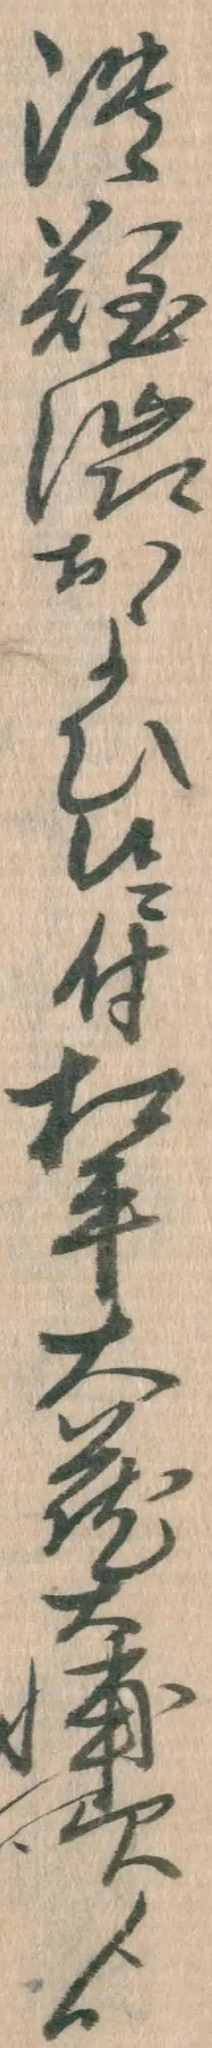潰難渋およひ候ニ付松平大蔵大大輔様ゟ
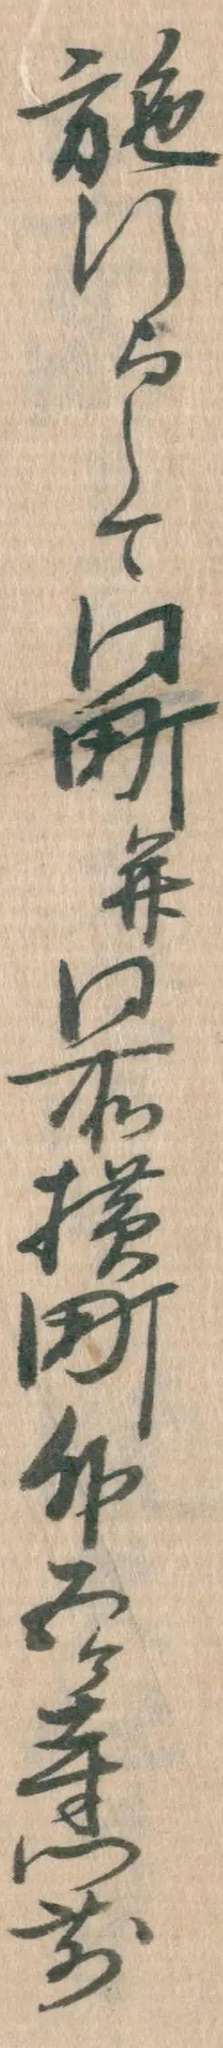施行として同町并同所横町外五ヶ寺門前
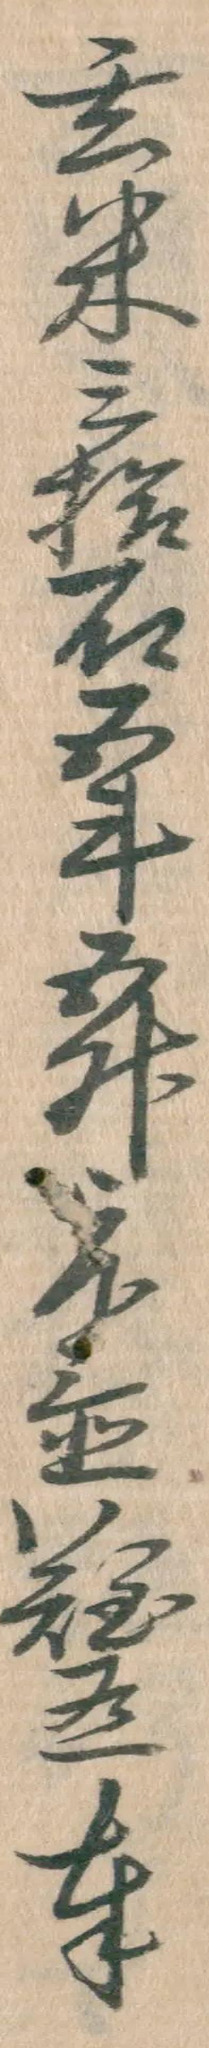玄米三拾石五斗五升差置難有奉
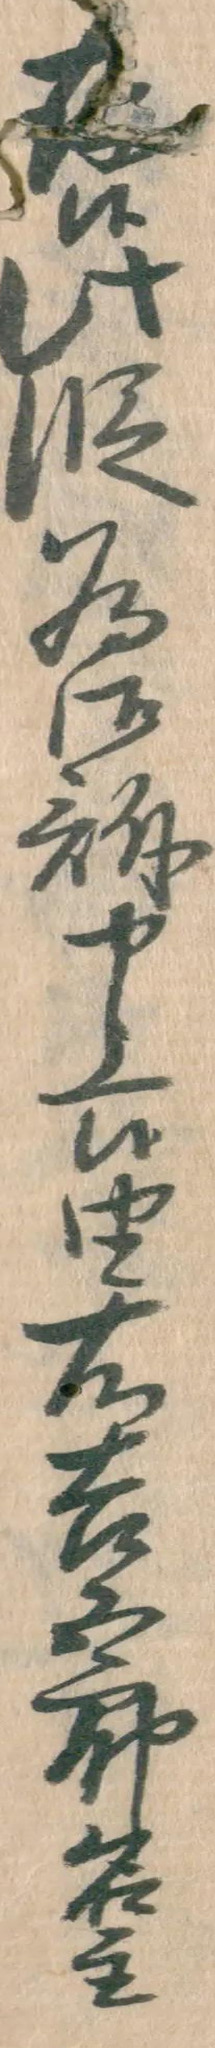存候此段為御訴申上候由右吉五郎名主
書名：武家方并寺院等ニテ施差出候一件
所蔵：国立国会図書館 National Diet Library, JAPAN
